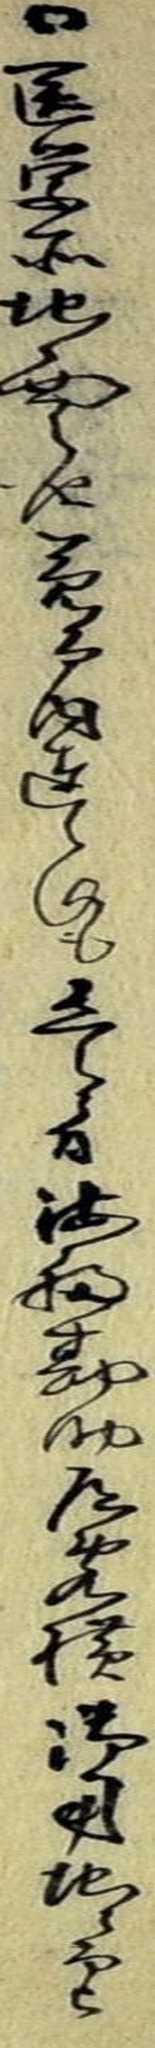○医学所地面之儀兼而内達之趣も有之候に付海福勘助屋敷横御用地に而被
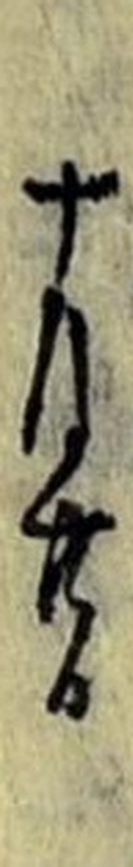十月廿日

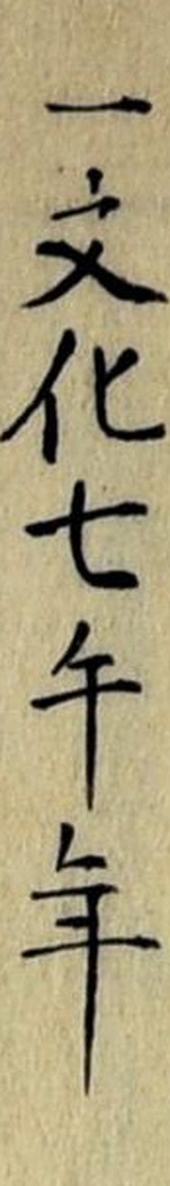一文化七午年
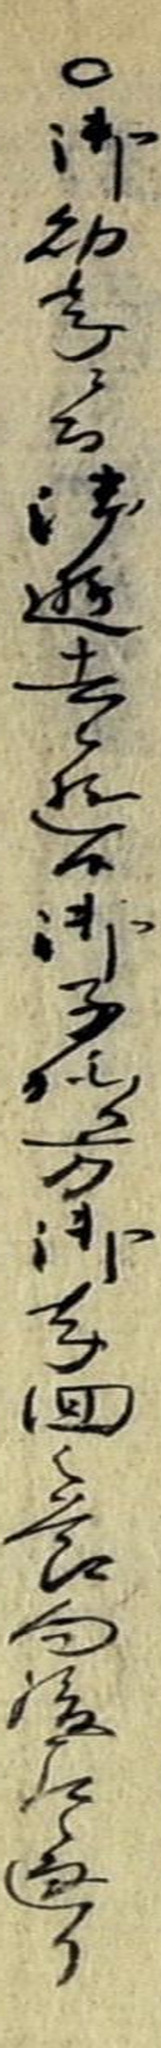○御幼年に而御逝去被遊候御子供方御年回之節向後左之通り
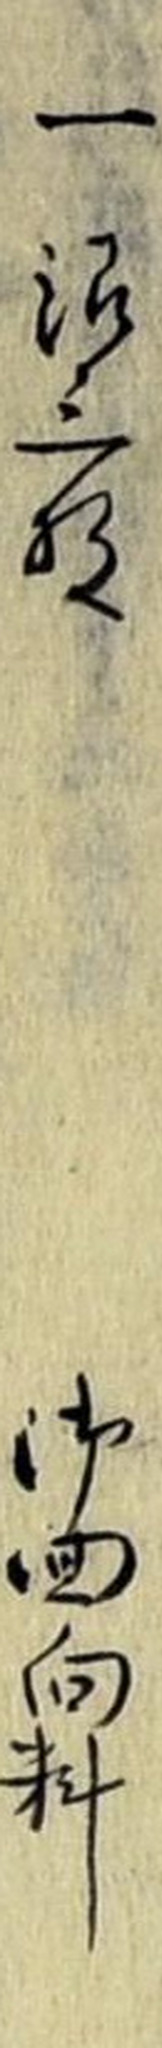一銀二枚御回向料
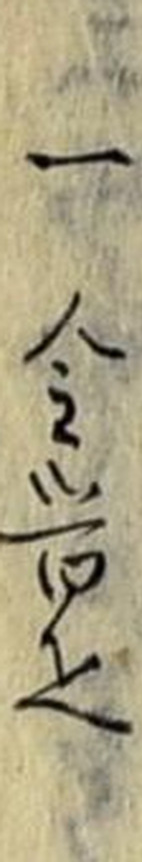一金弐百疋
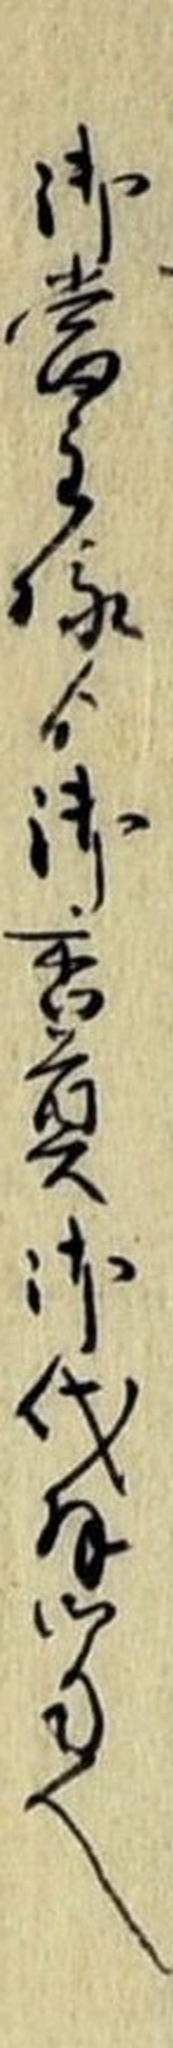御当主様ゟ御香典御代拝御用人
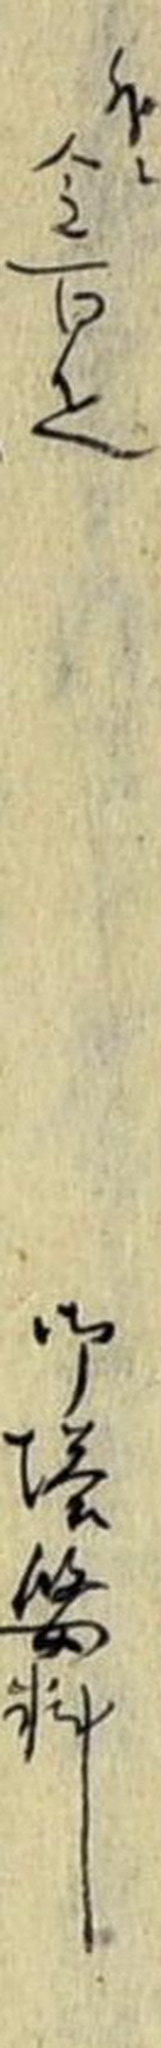金百疋御塔婆料
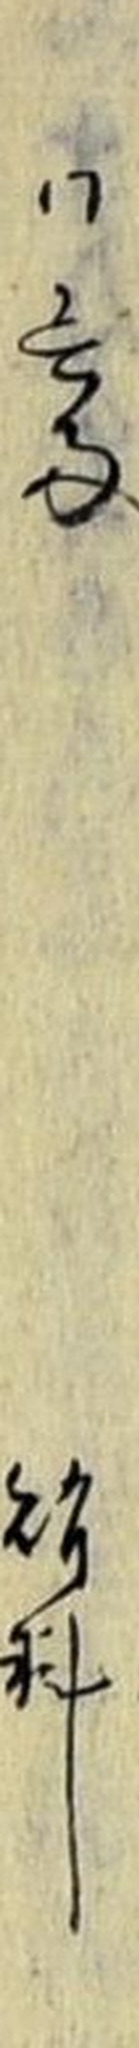同壱両賄料
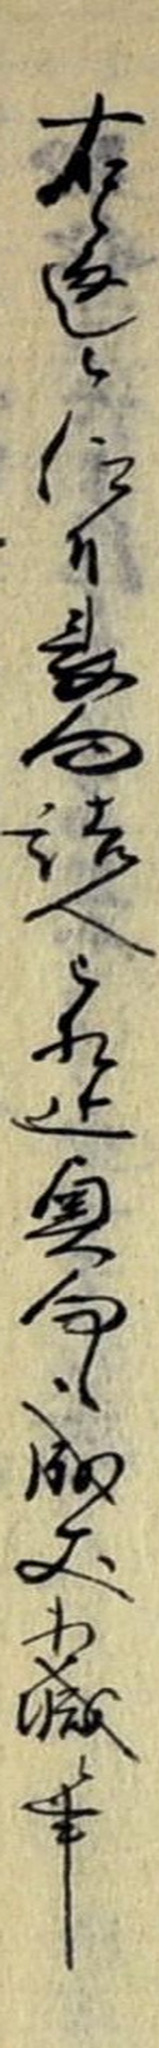右之通被仰付表向詰人被相止奥向も成丈相減候事
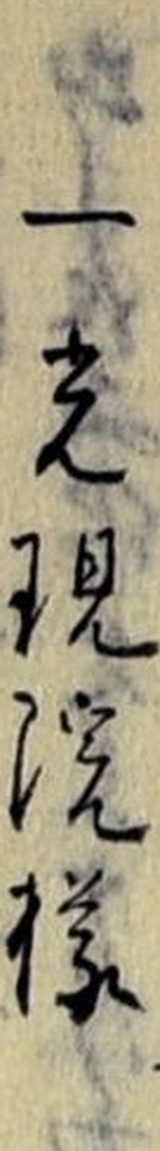一光現院様
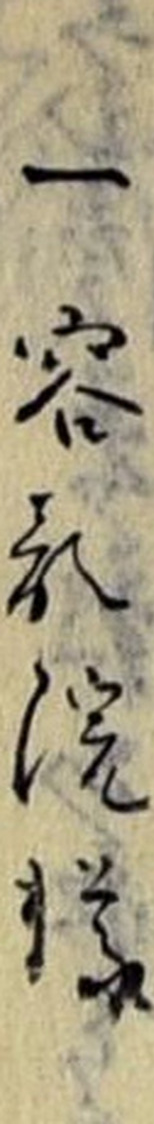一容顔院様
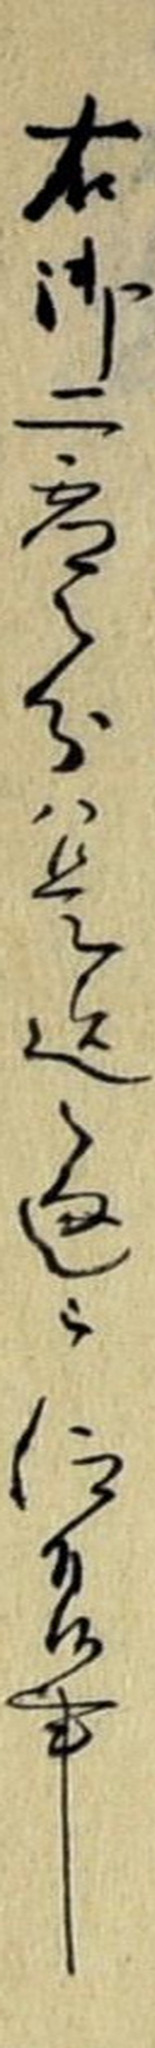右御二君之分は是迄之通被仰付候事
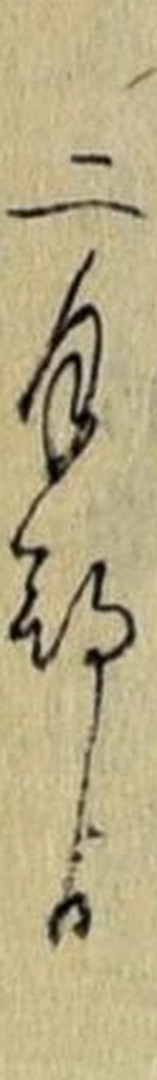二月朔日
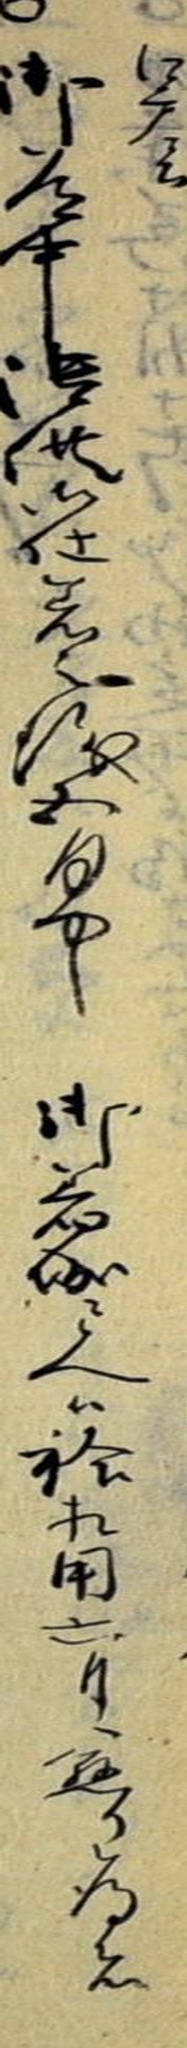○御道中御供御仕着之儀五月中御着城に候へは袷相用六月へ懸り候得は
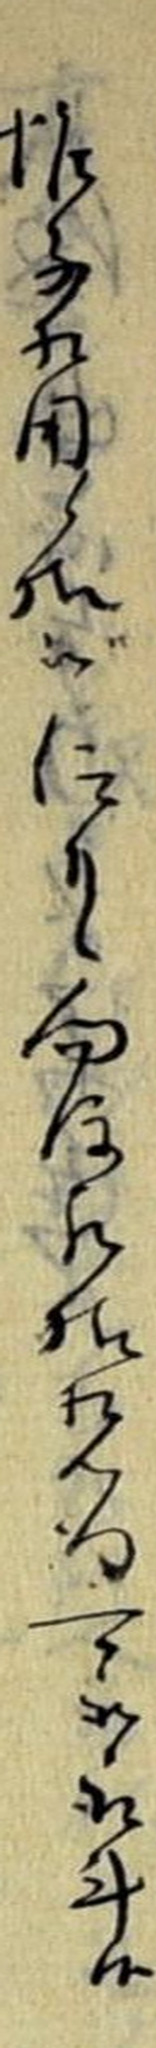帷子相用候様被仰付候向後左様相心得可被取斗候
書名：命令之部 四
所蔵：福井県文書館 Fukui Prefectural Archives
